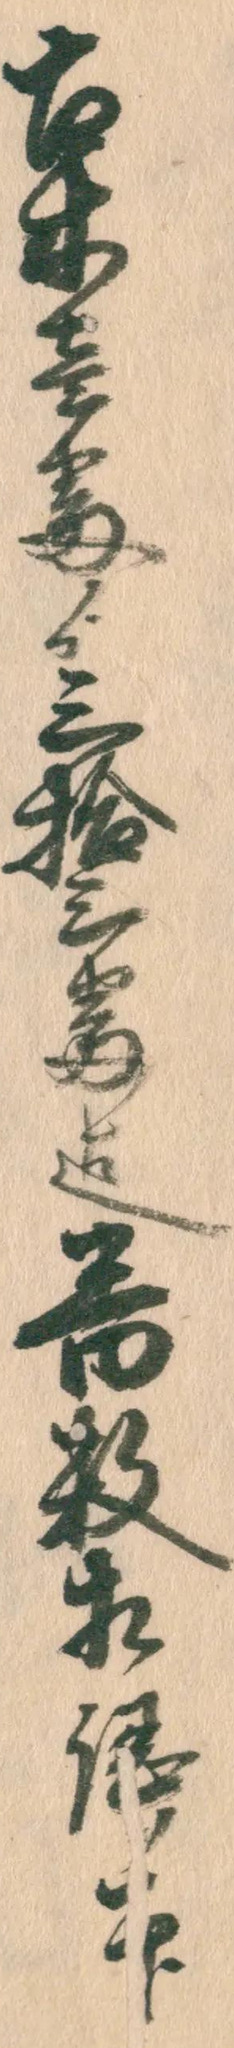古木壱番ゟ三拾三番迄番数相認メ印
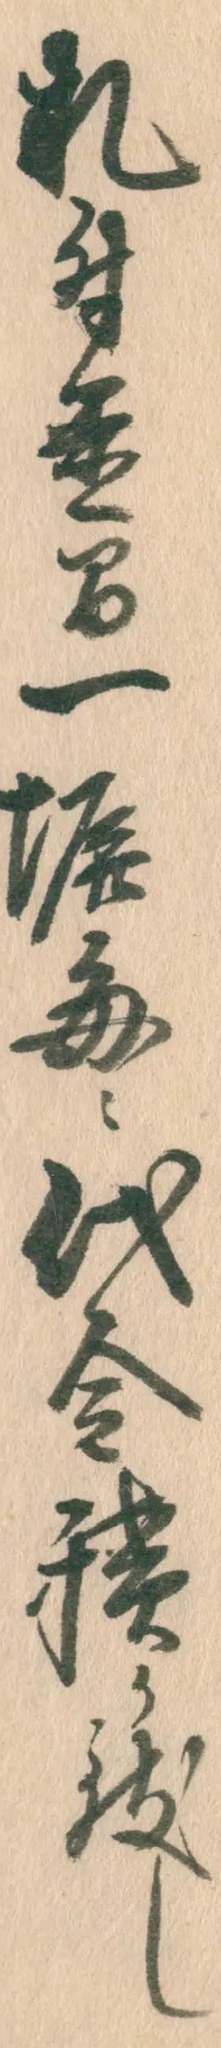札付置間一塀毎ニ代金積り致し

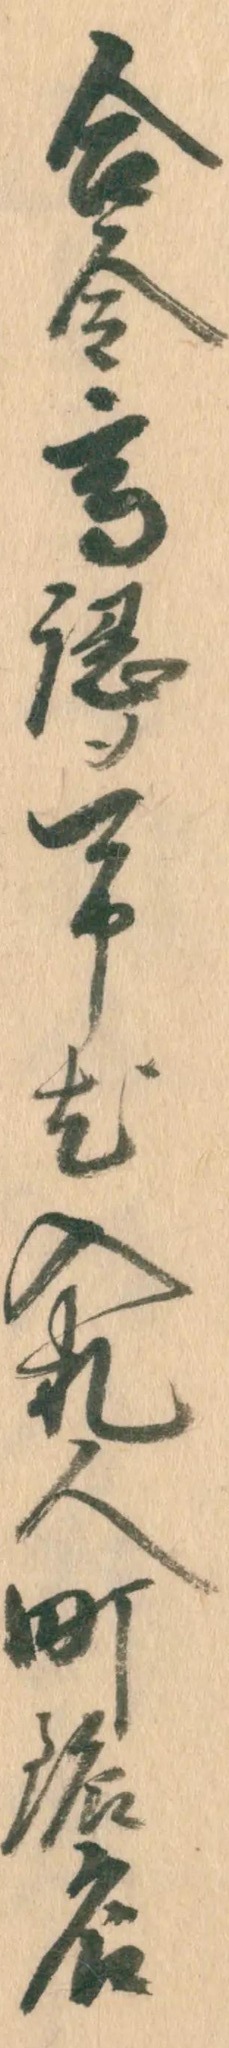合金高認メ可申尤入札人町銘名
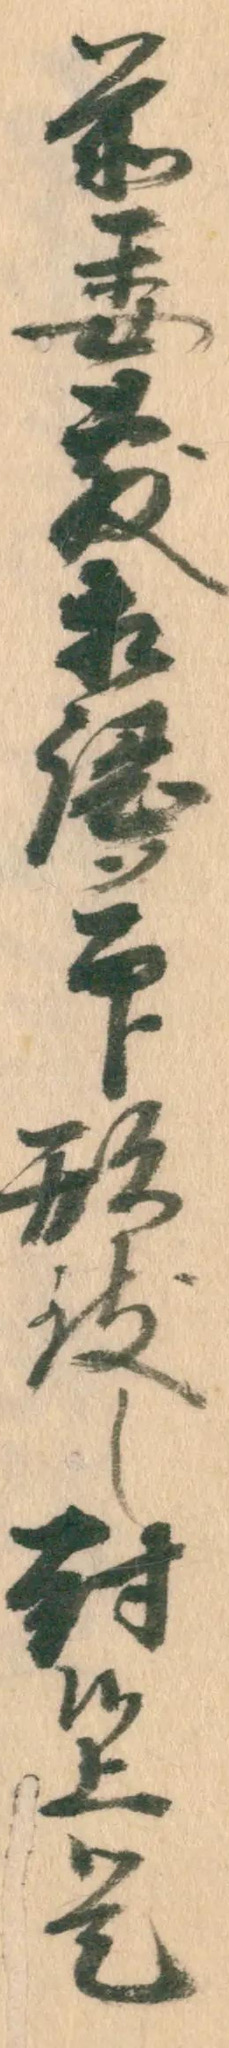前委敷相認メ印形致し封候上是
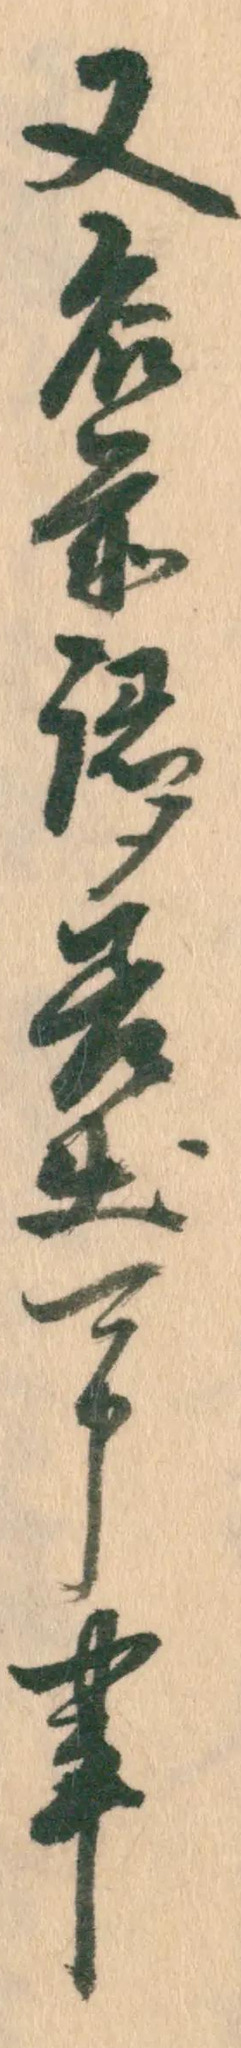又名前認メ差出可申事
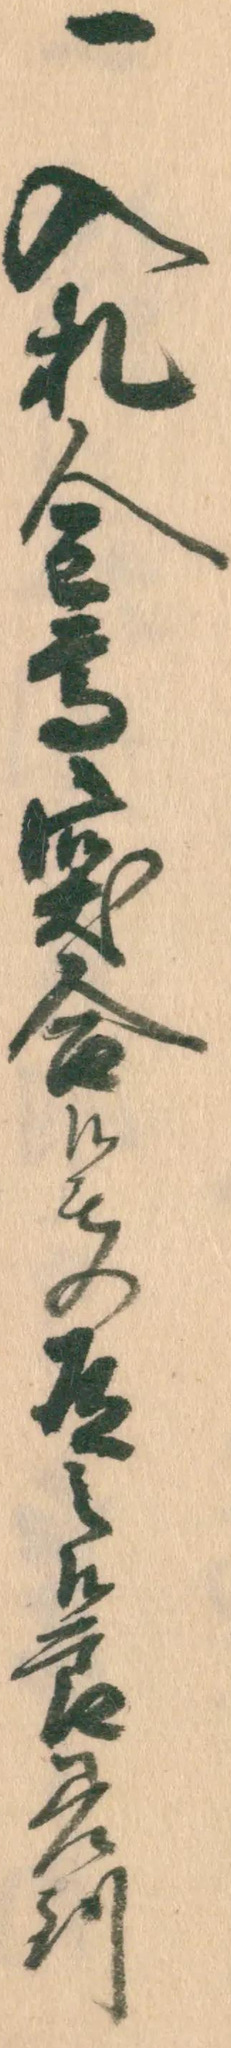一入札金高突合候もの有之候節差列
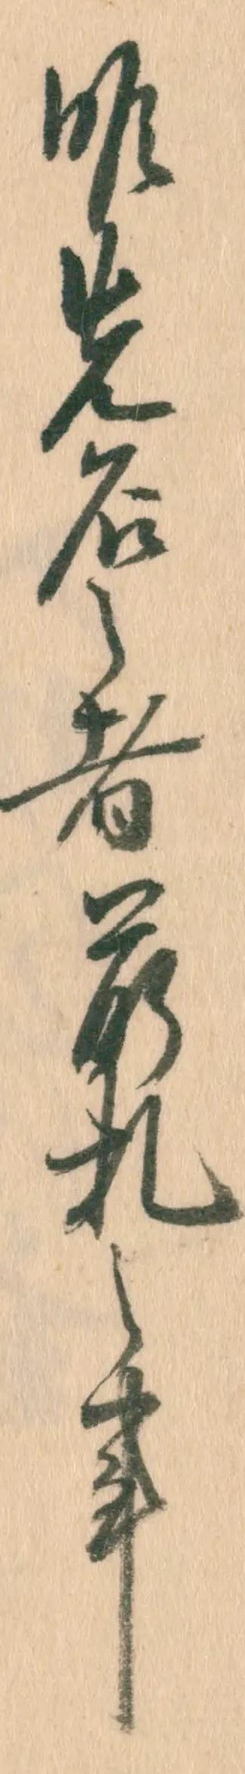順先名之者落札之事
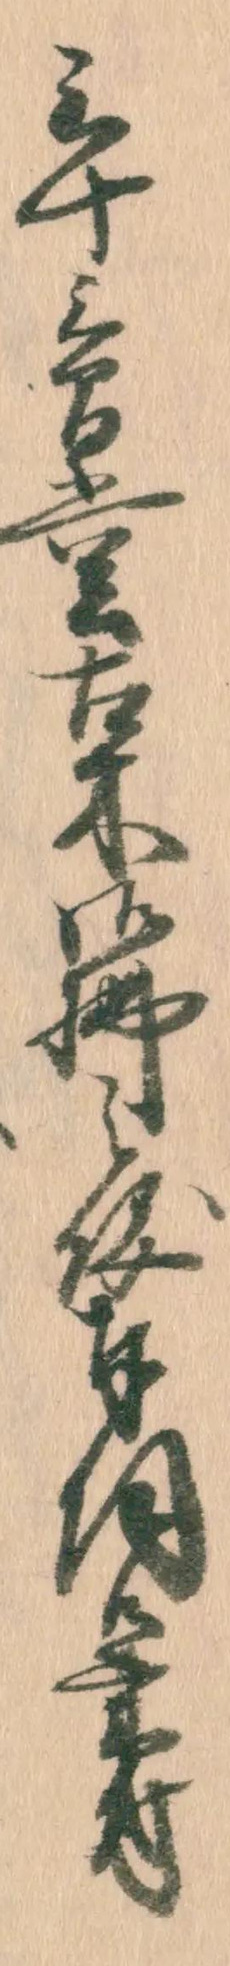│三十三間堂古木御払之儀奉伺候書付
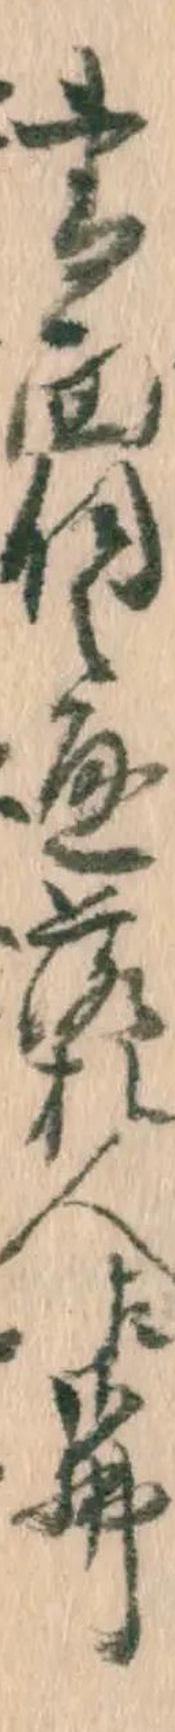│書面伺之通落札人え御払
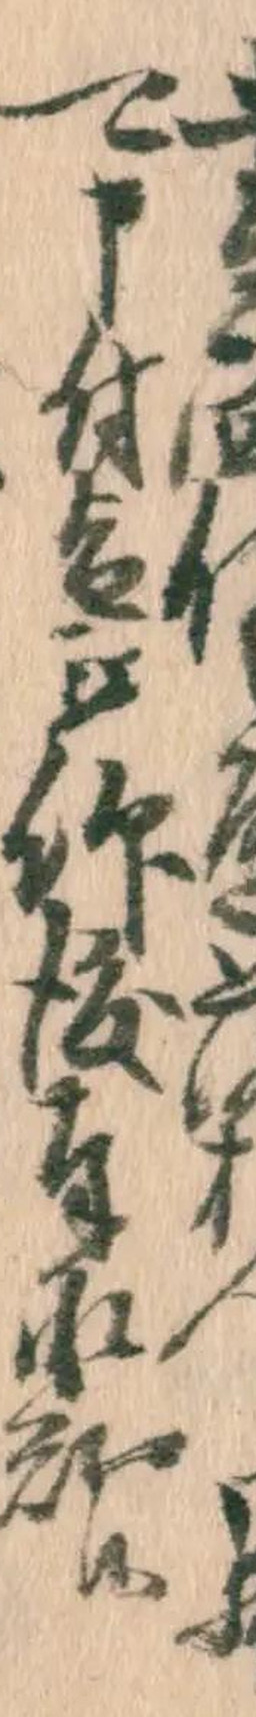│可申付旨被仰渡奉承知候
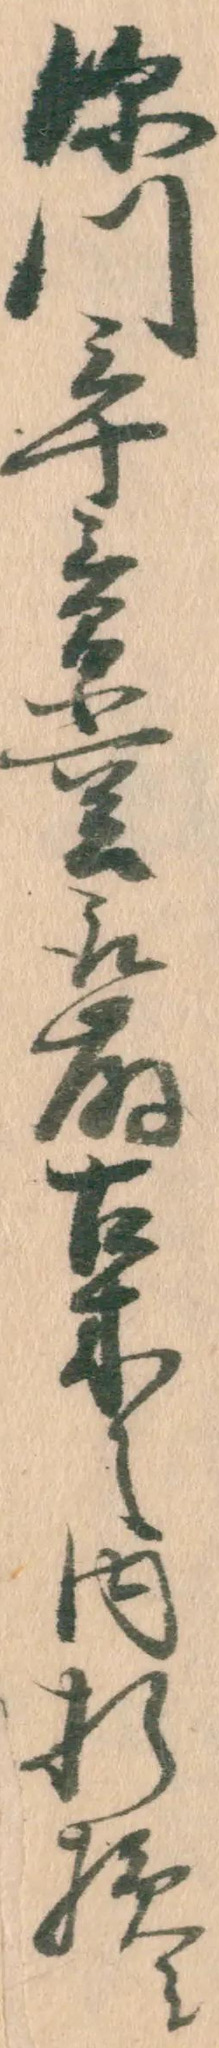深川三十三間堂取崩古木之内折損シ
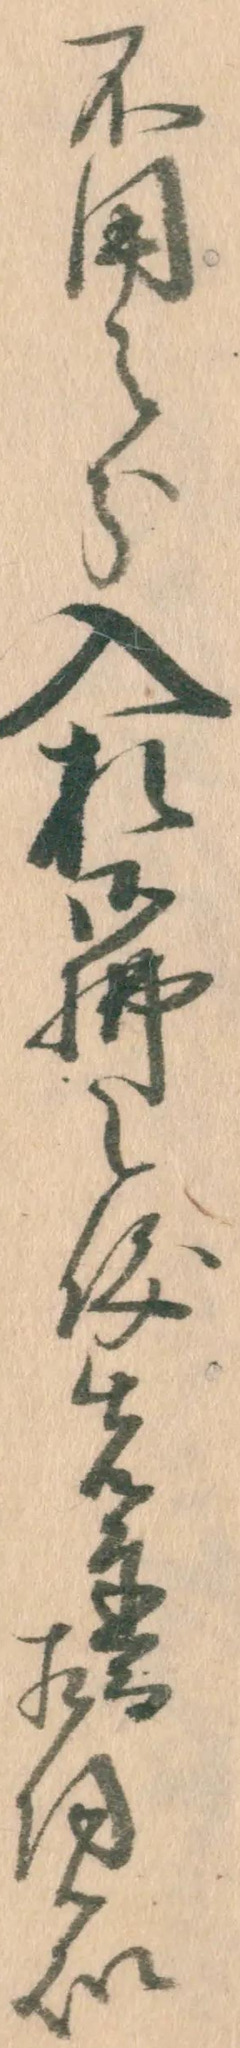不用之分入札御払之儀先達て相伺候処
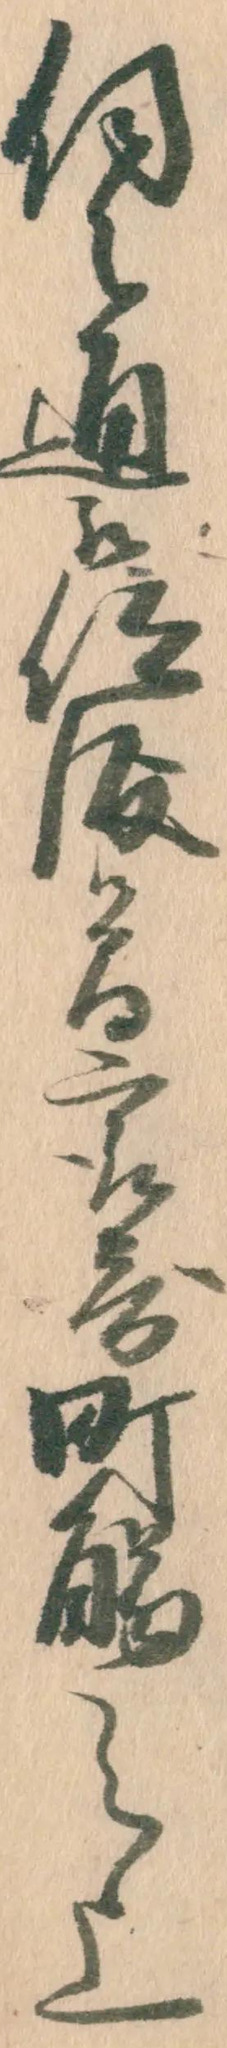伺之通被仰渡候間最寄町触之上

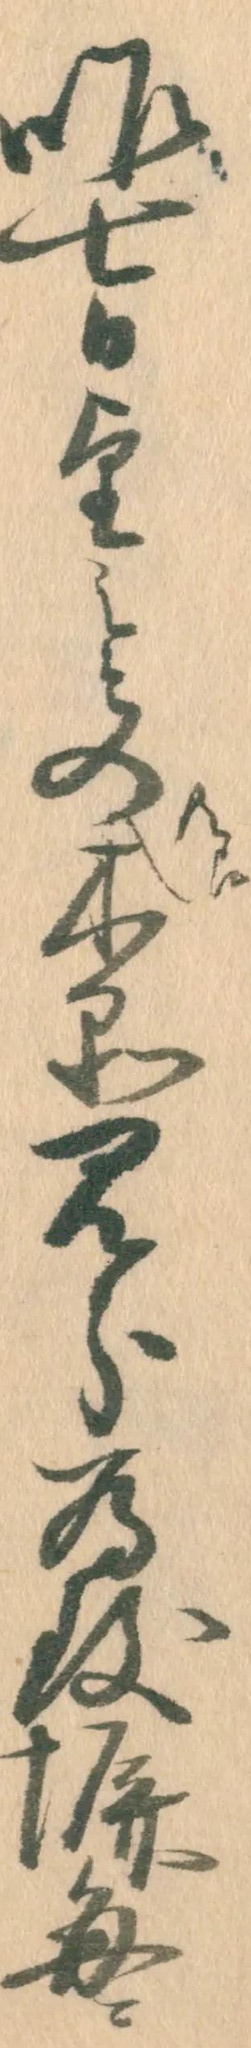昨七日望のもの共え木品見分為致塀毎ニ
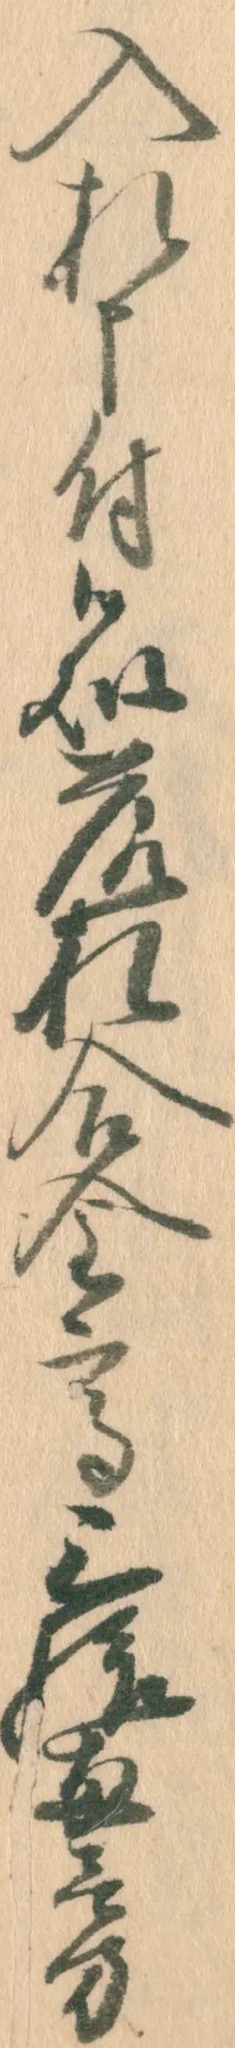入札申付候処落札合金金高三拾両壱分
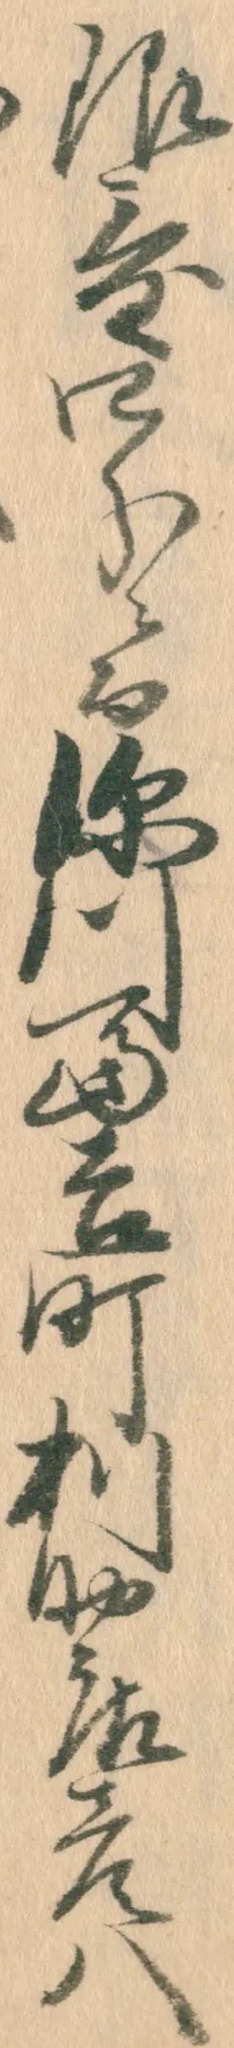銀三匁四分ニて深川富吉町利助店彦八
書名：三十三間堂. [2]
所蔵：国立国会図書館 National Diet Library, JAPAN
